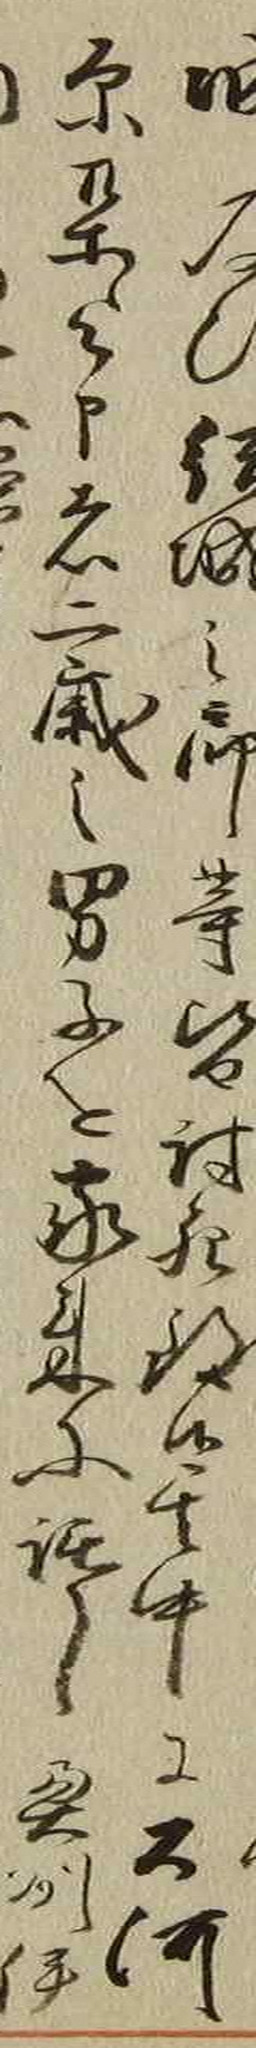原某与申者二歳之男子を家来に託し奥州伊
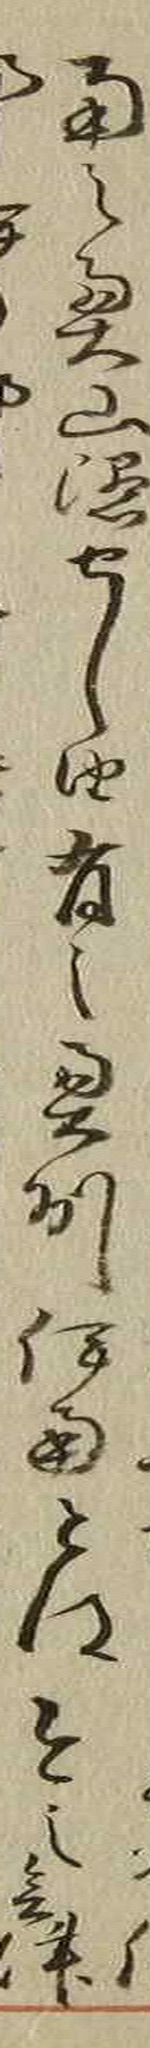南之奥山隠せし由有之奥州伊南とは今之会津
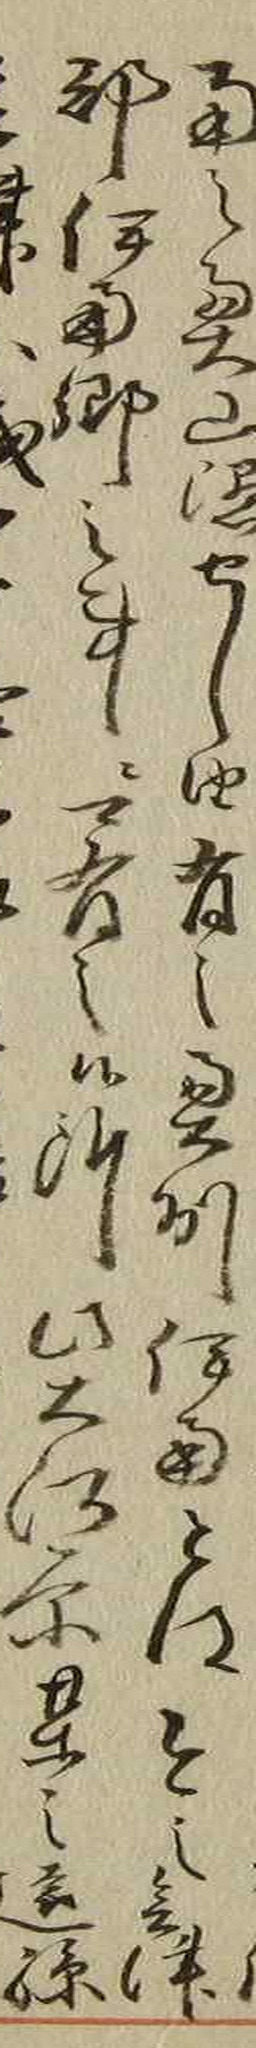郡伊南郷之事ニ可有之候所此大河原某之遠孫
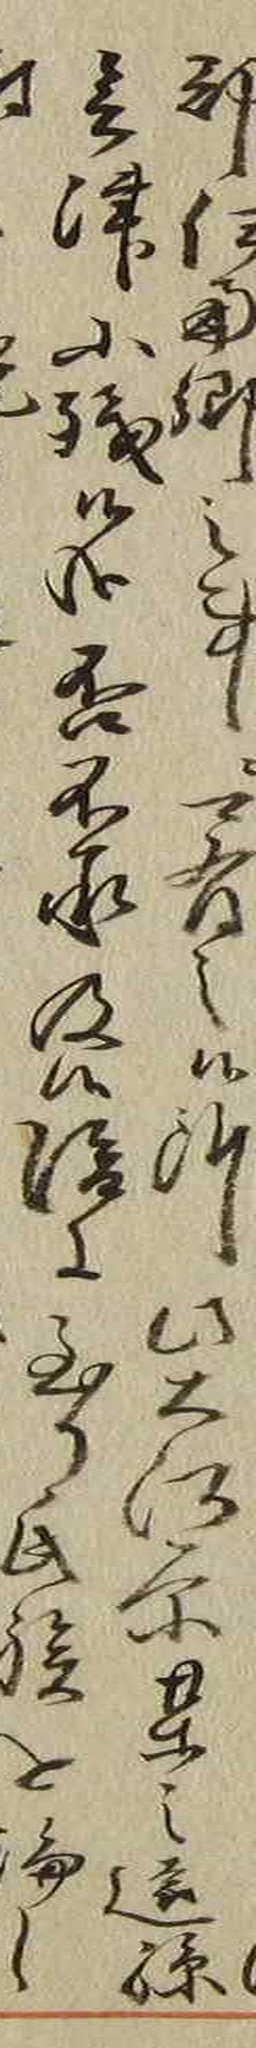会津に残候哉否不承及候後に至り氏族を論し
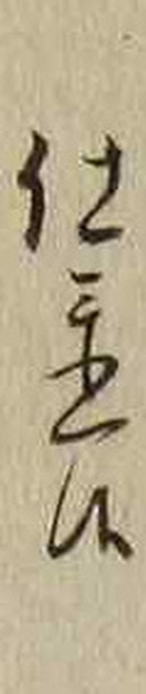仕置候
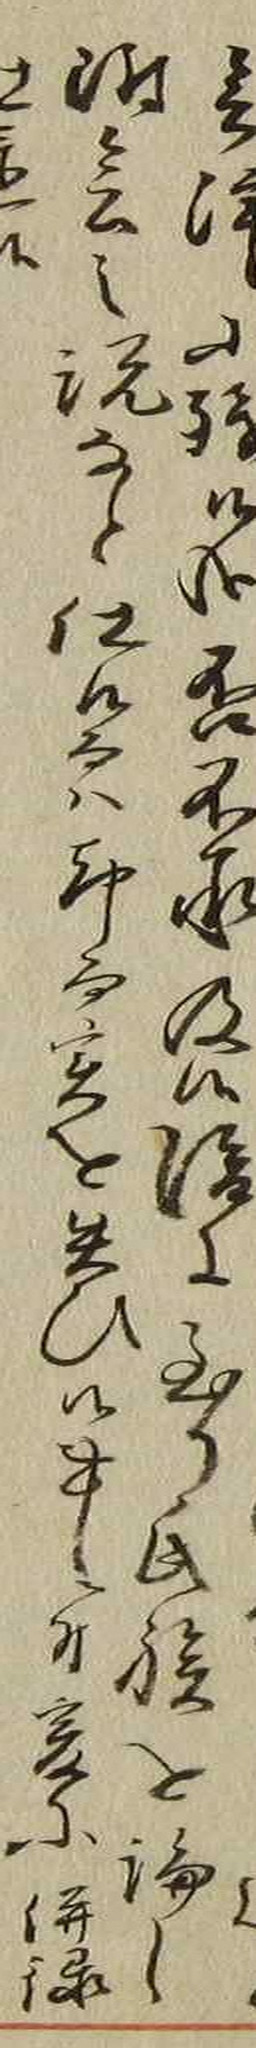附言之説なと仕候而ハ却而実を失ひ候事ニ付爰に併録
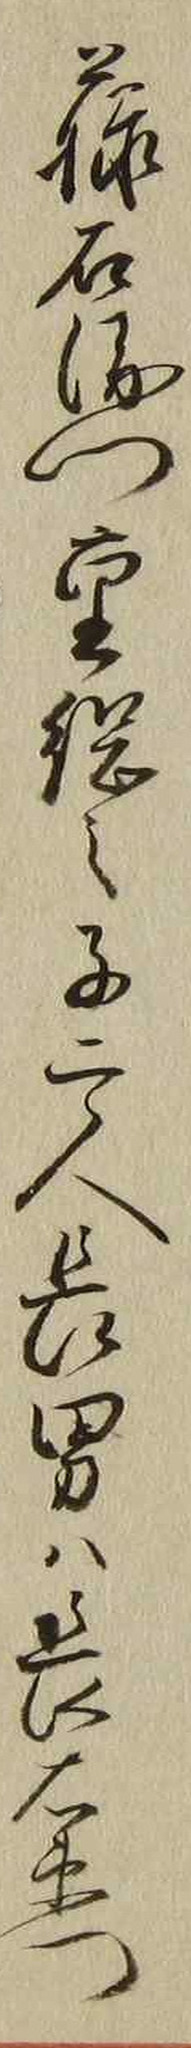藤右衛門重綱之子二人長男ハ長右衛門
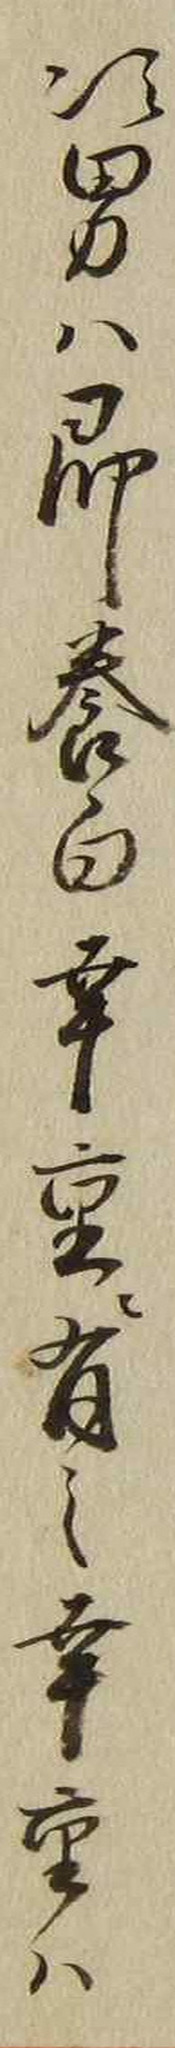次男八郎養白幸重ニ有之幸重ハ
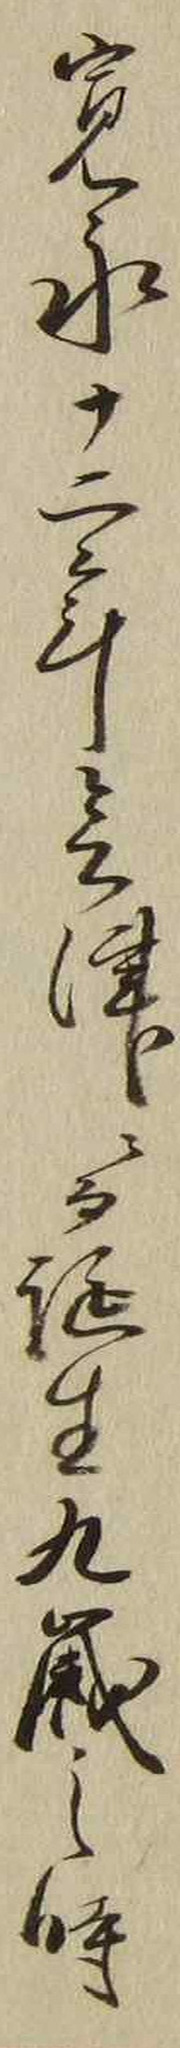寛永十二年会津ニ而誕生九歳之時
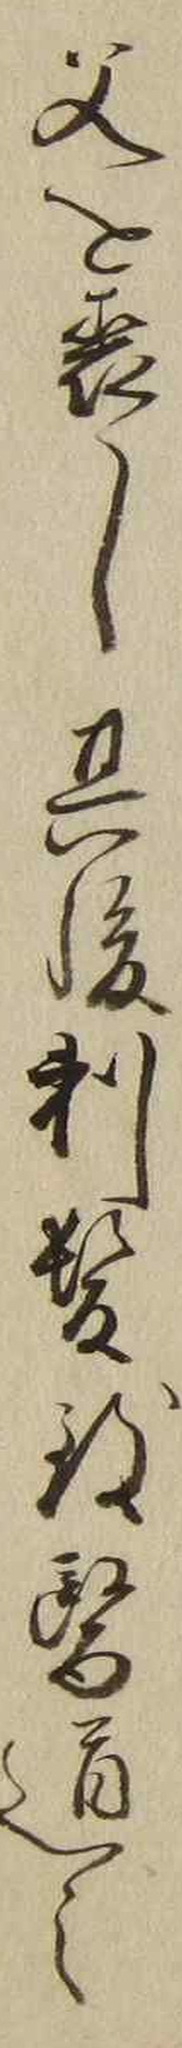父を喪し其後剃髪致医道之

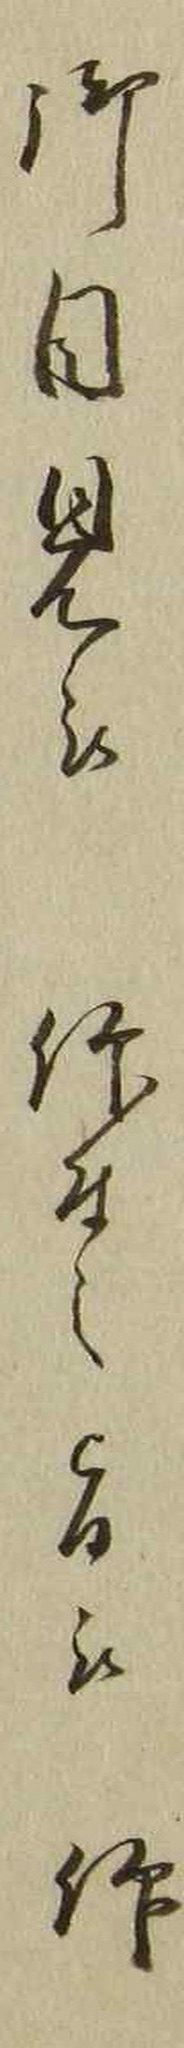御目見被仰付之旨被仰
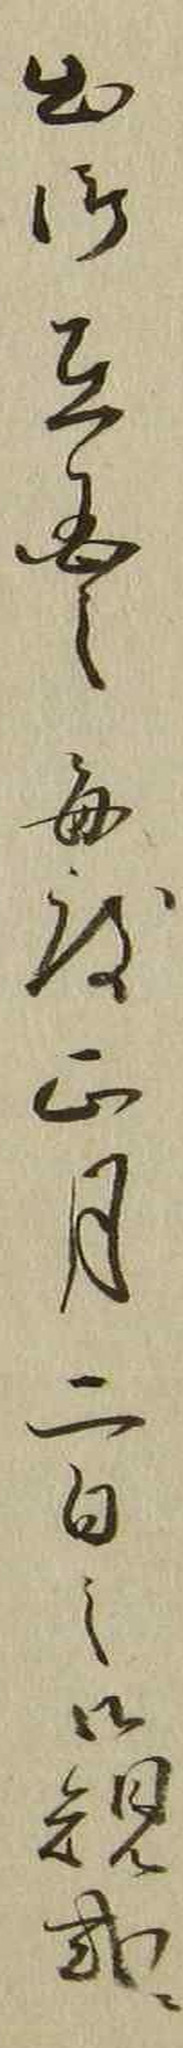出御在国之毎度正月二日之御規式ニ
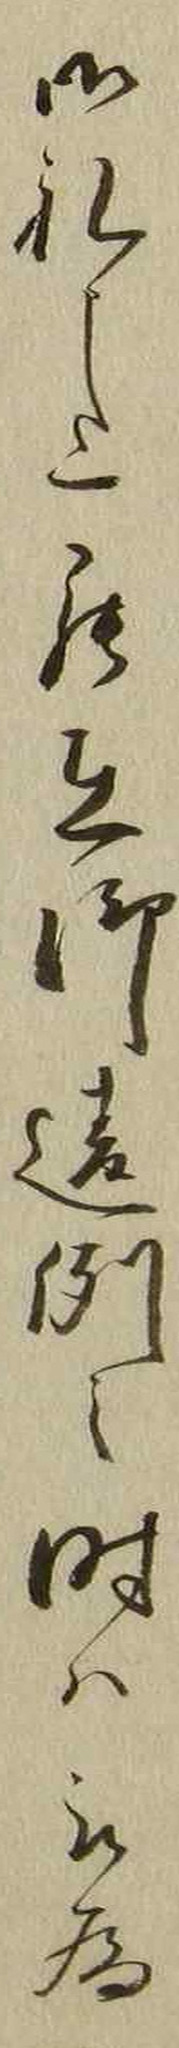御礼申上罷在御違例之時ハ被為
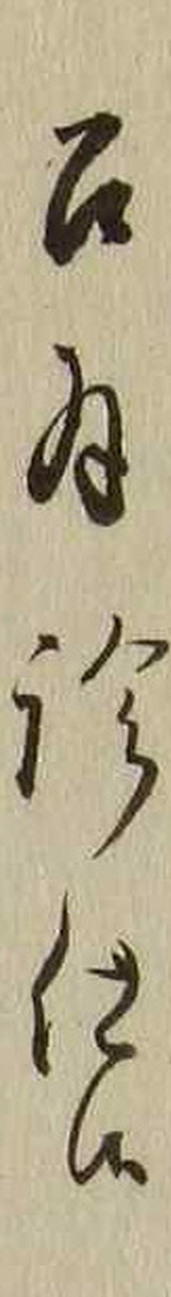召拝診仕候
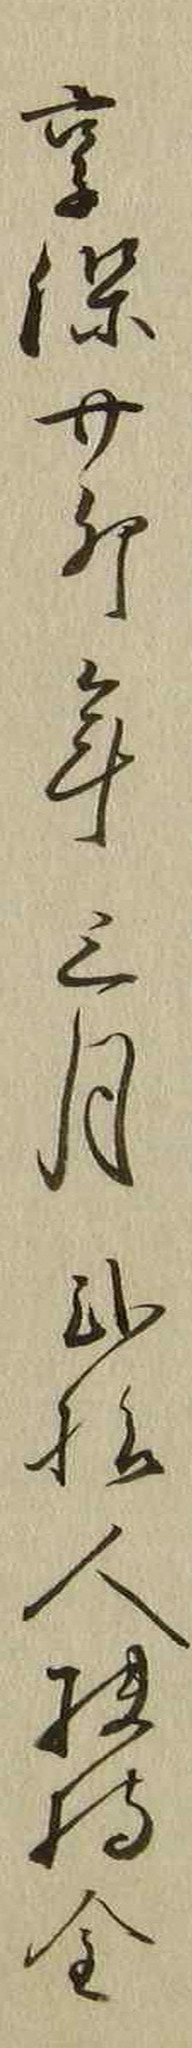一享保廿卯年三月弐拾人扶持金
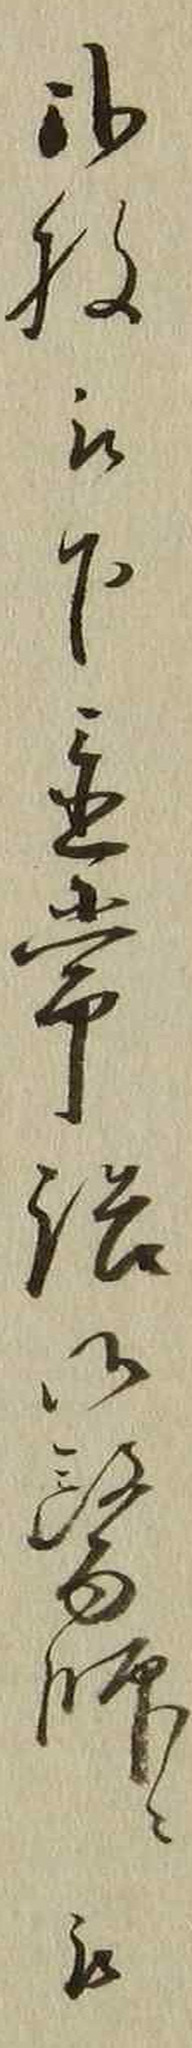弐枚被下置常詰御医師ニ被
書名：諸士系譜　巻之68　を之部2
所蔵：会津若松市立会津図書館
